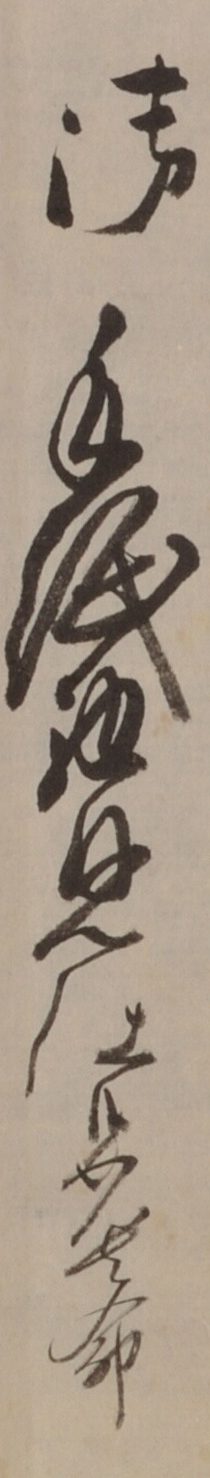御手紙拝見仕候如貴命
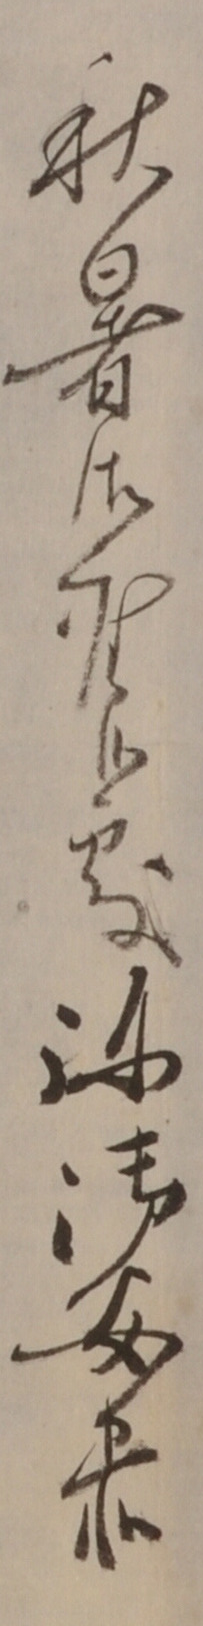秋暑御座候処弥御安泰
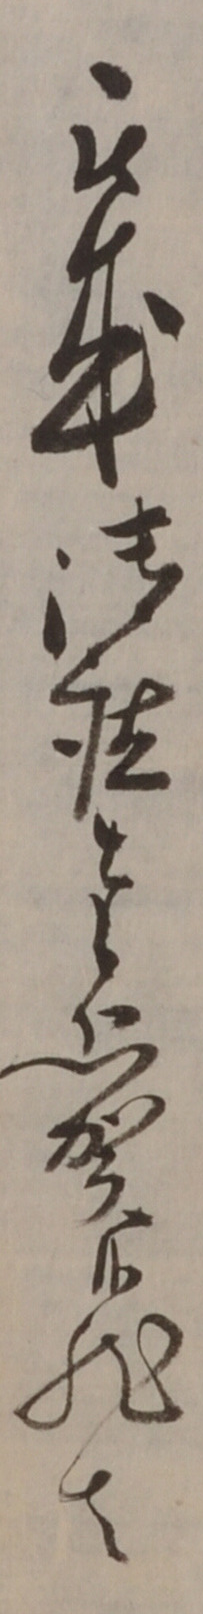被成御座候奉恐賀候然は
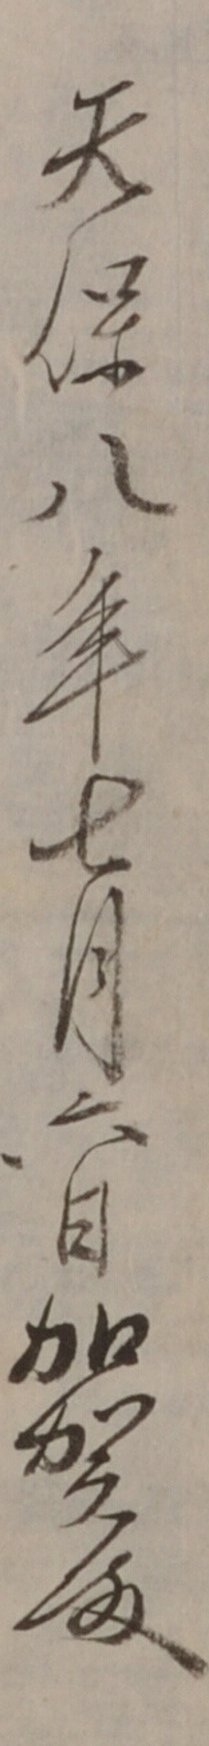天保八年七月六日加賀殿
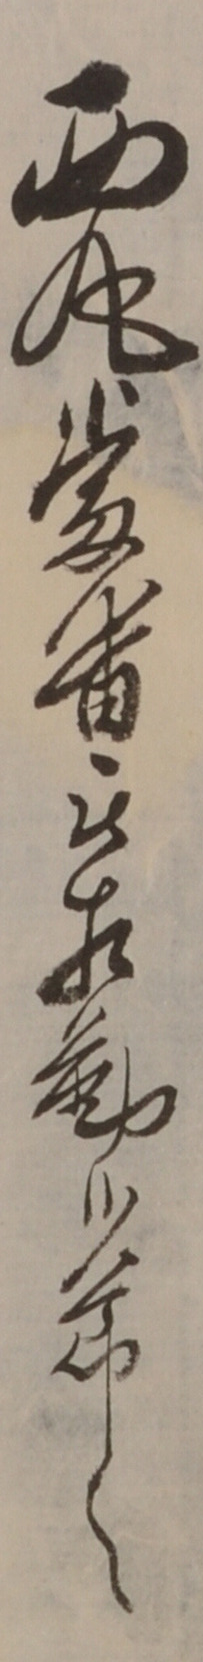西丸当番被相勤候節之
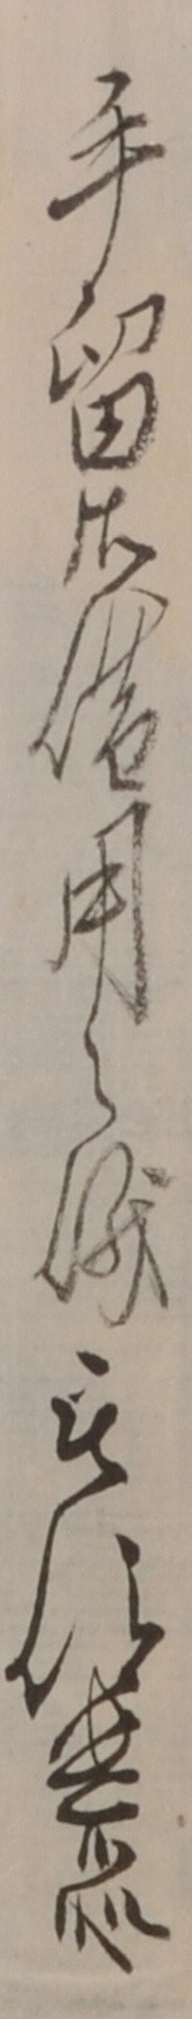手留御借用之儀被仰遣候処
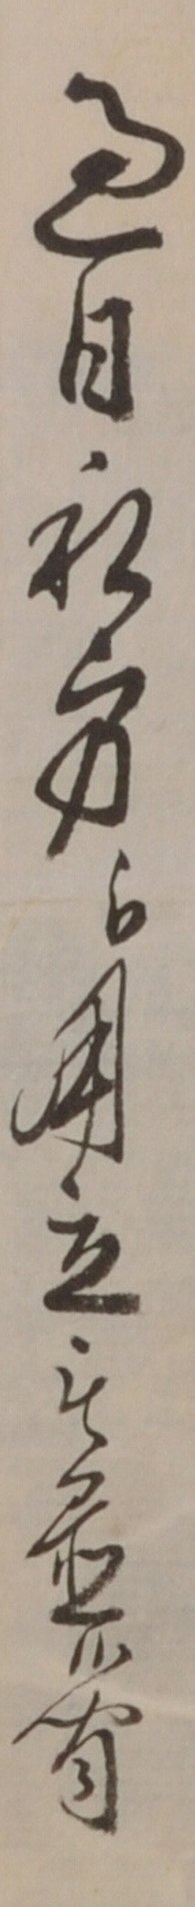過日私方江用立被置候間
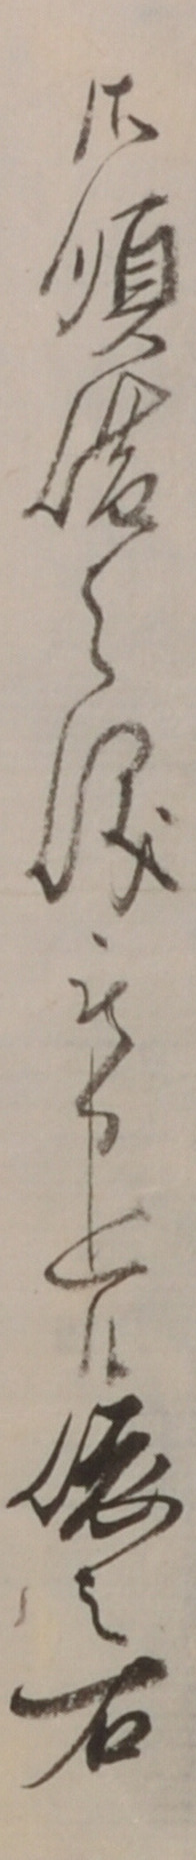御順借之儀被申上候仍之右
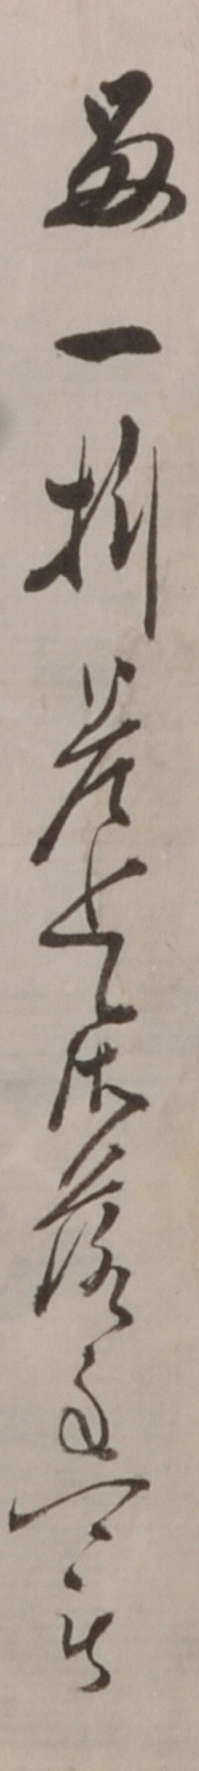留一折差上候御落手可被

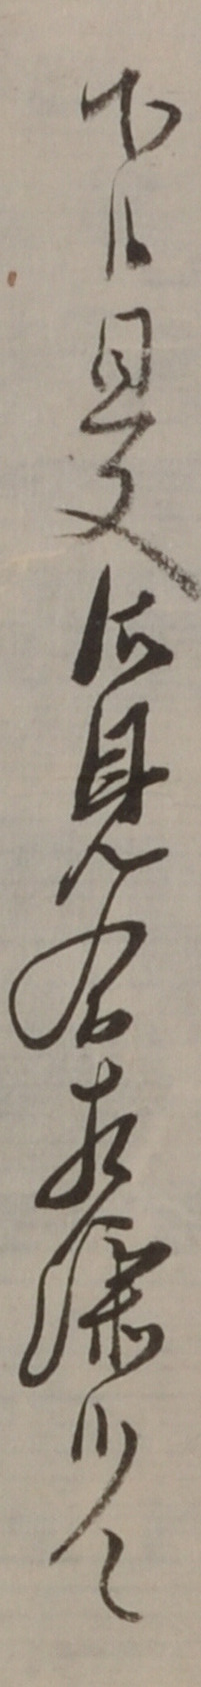下候且又御見合相済候ハヽ
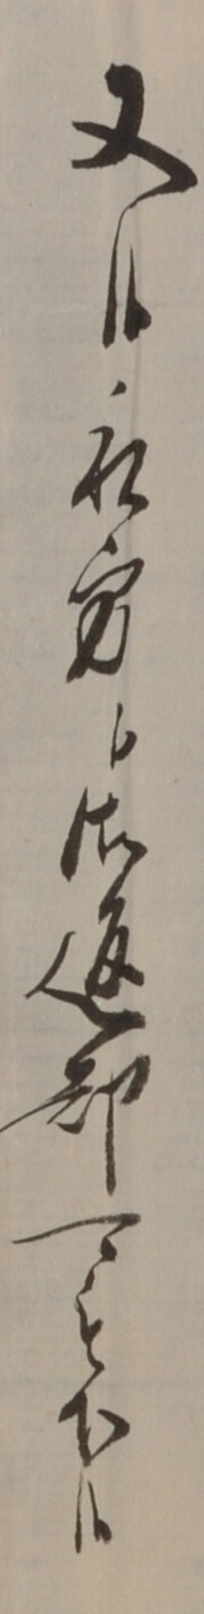又候私方江御返却可被下候
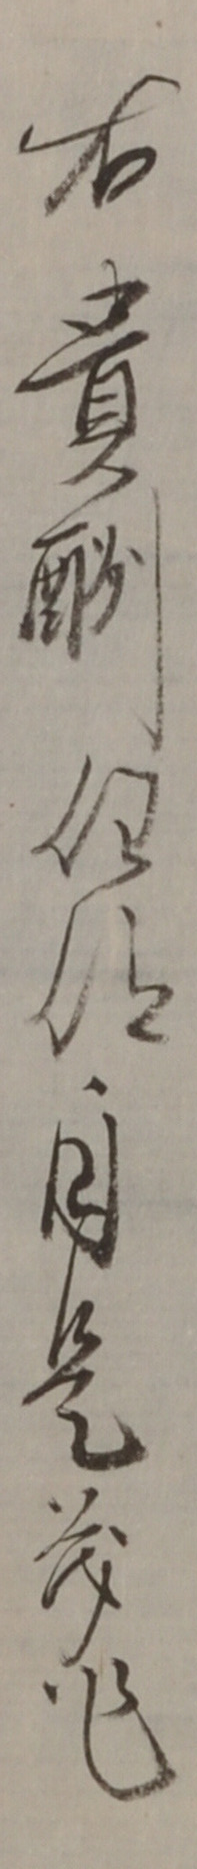右貴酬任仰自是茂乍
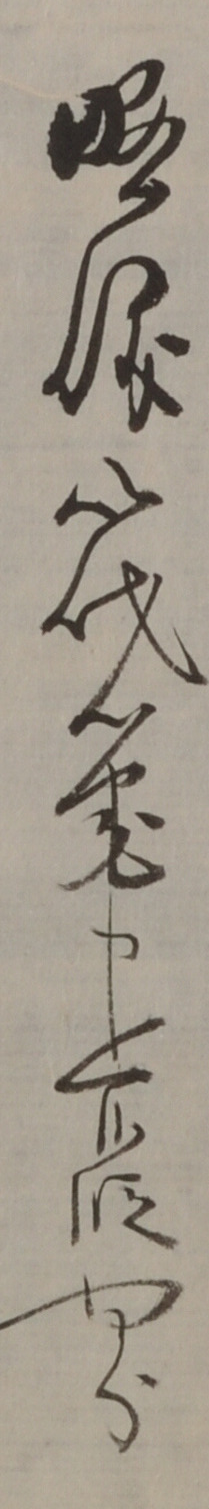略儀以代筆申上候段四何分
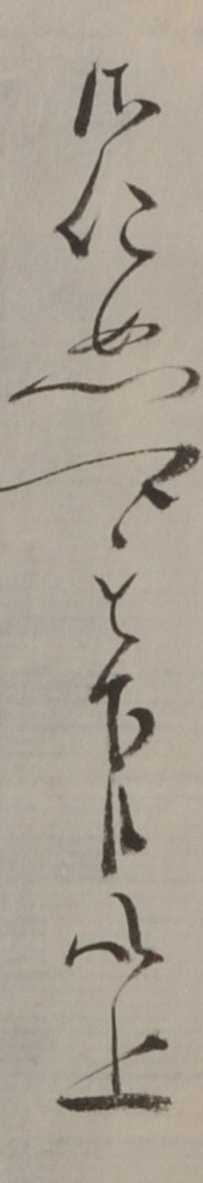御仁恕可被下候以上
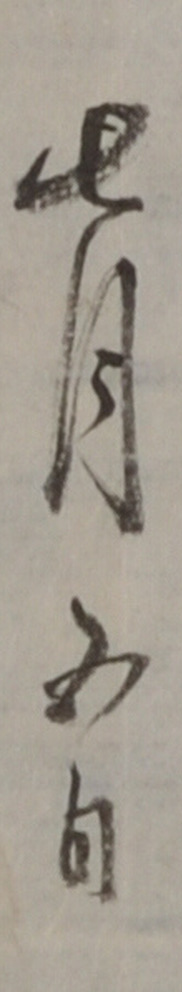七月五日

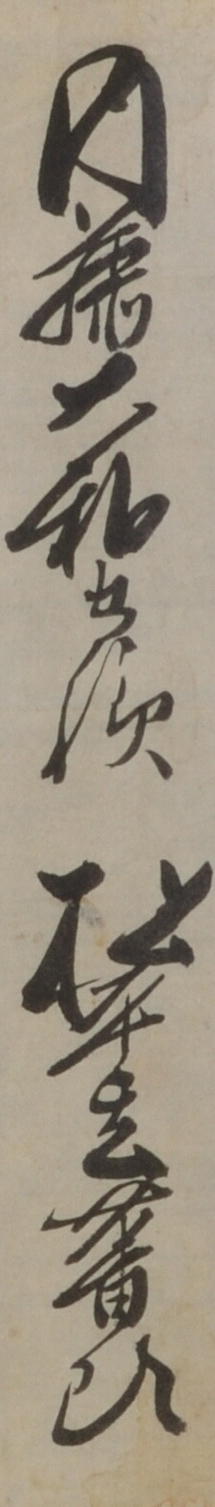内藤大和守様松平玄蕃頭
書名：書状
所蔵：伊那市立高遠町図書館・合同会社AMANE
